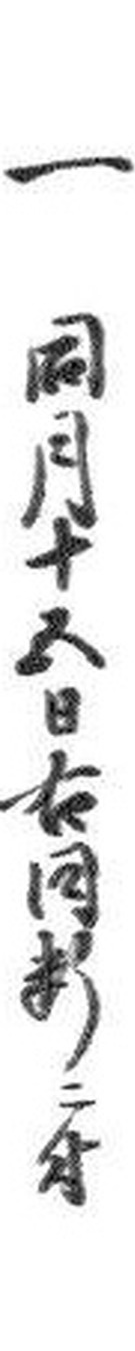一同月十五日右同断ニ付
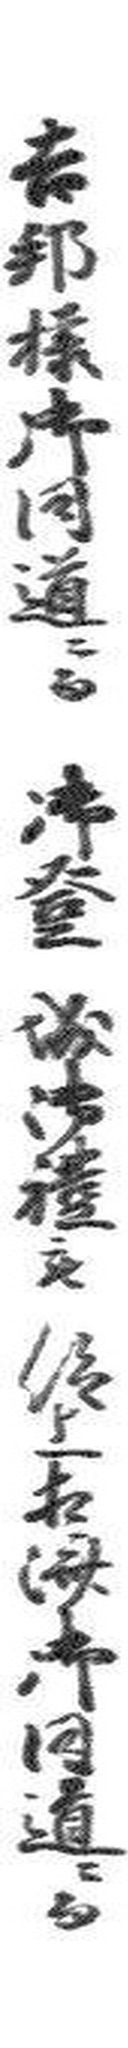吉邦様御同道ニ而御登城御礼被仰上相済御同道ニ而
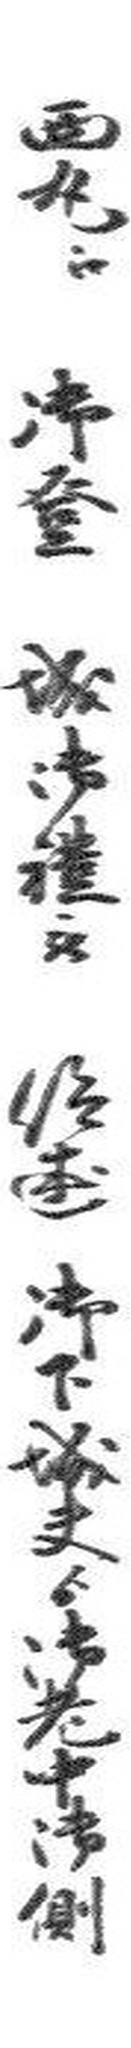西丸江御登城御礼被仰述御下城夫ゟ御老中御側
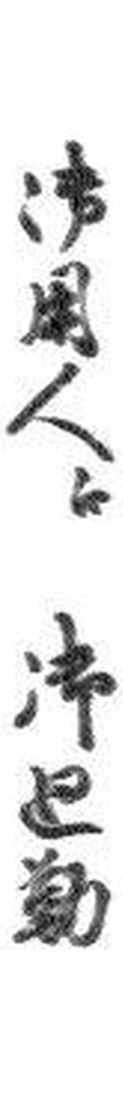御用人江御廻勤

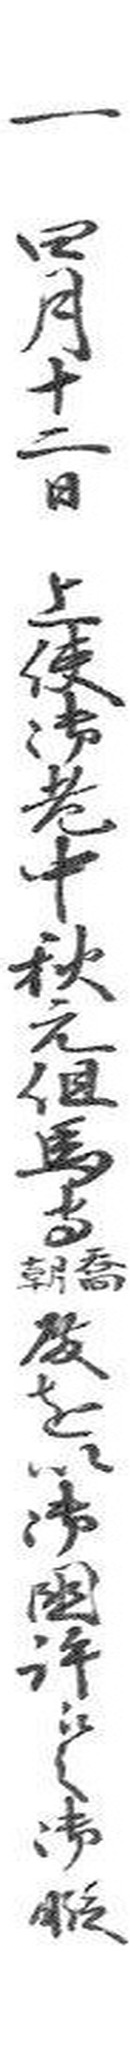一四月十二日上使御老中秋元但馬守喬朝殿を以御国許江之御暇
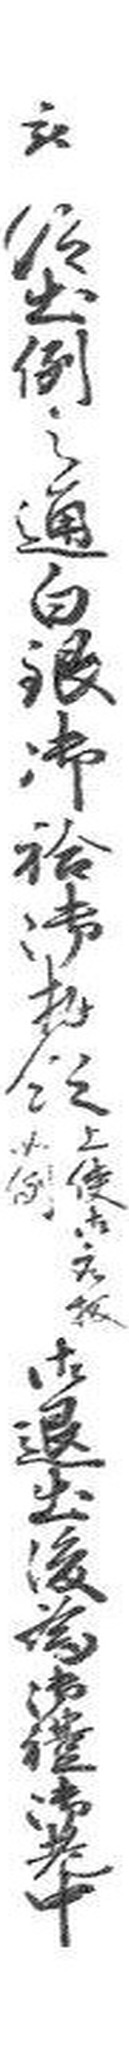被仰出例之通白銀御袷御拝領上使御取扱如例御退出後為御礼御老中
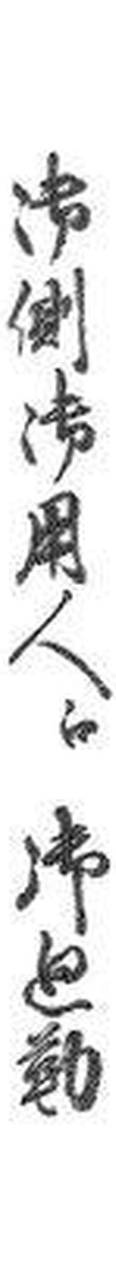御側御用人江御廻勤
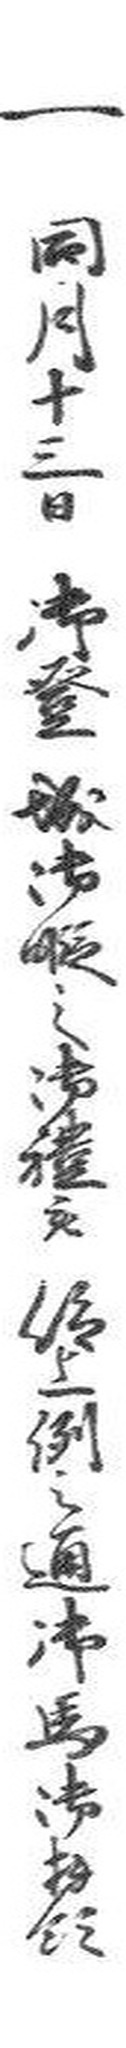一同月十三日御登城御暇之御礼被仰上例之通御馬御拝領
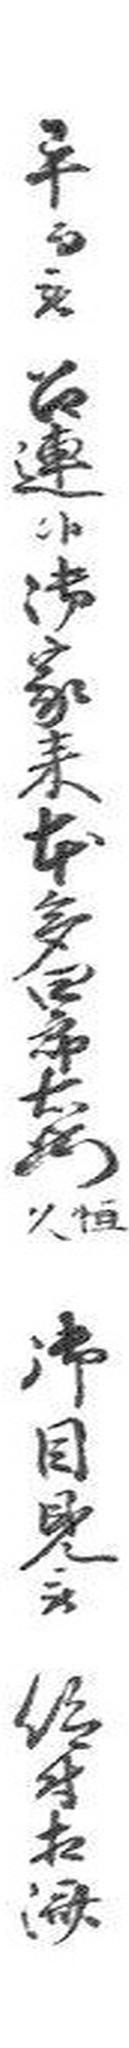畢而被召連候御家来本多四郎右衛門恒久御目見被仰付相済
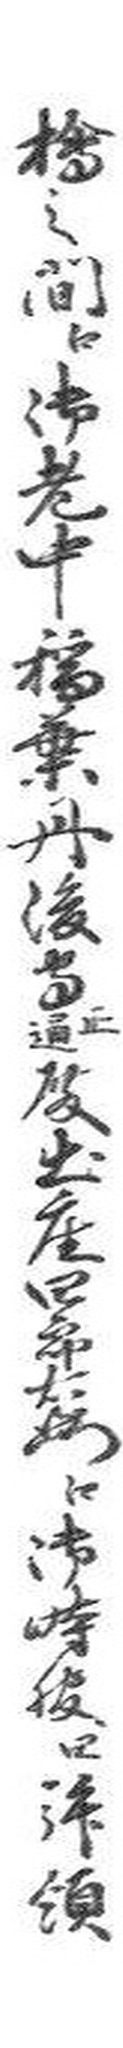桧之間江御老中稲葉丹後守正通殿出座四郎右衛門江御時服四拝領
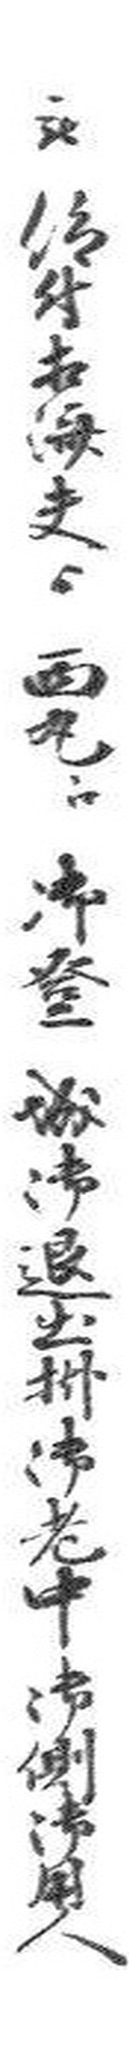被仰付相済夫ゟ西丸江御登城御退出出掛御老中御側御用人
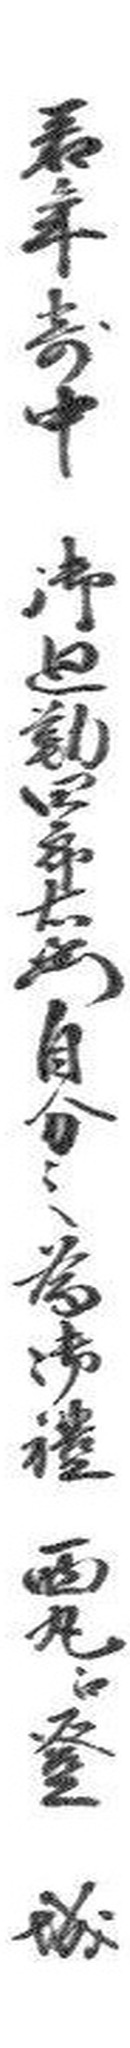若年寄中御廻勤四郎右衛門自分之為御礼西丸江登城
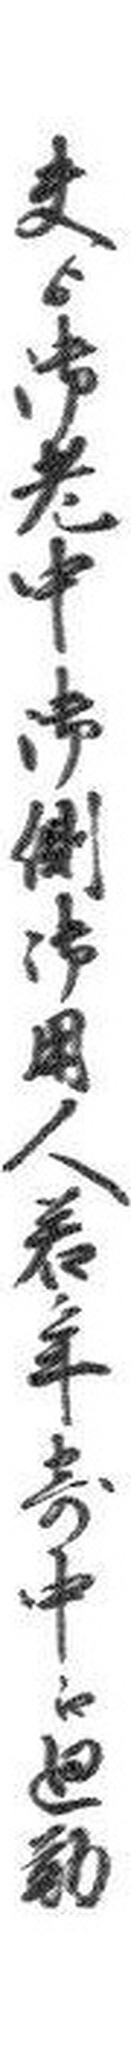夫ゟ御老中御側御用人若年寄中江廻勤
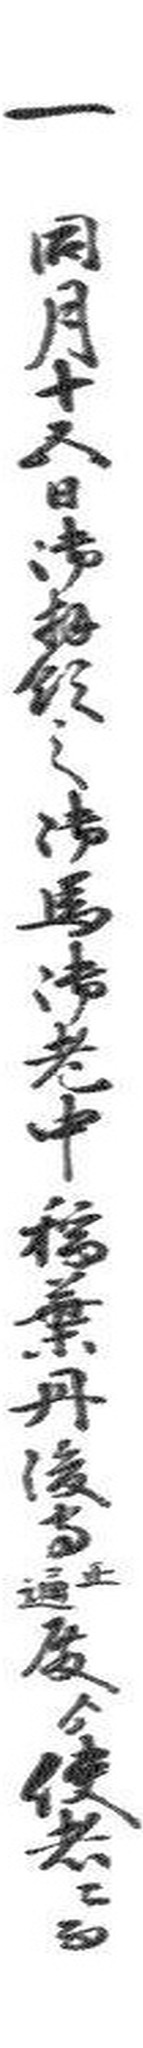一同月十五日御拝領之御馬老中稲葉丹後守正通殿ゟ使者ニ而
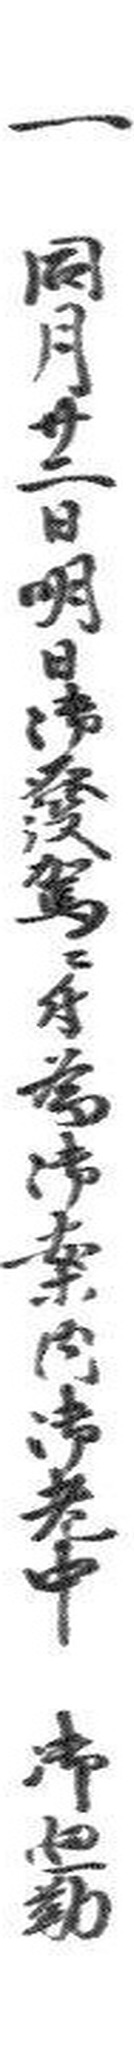一同月廿二日明日御発駕ニ付為御案内御老中御廻勤
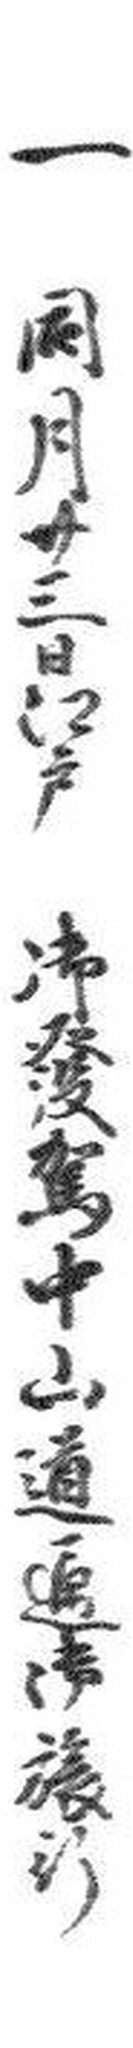一同月廿三日江戸御発駕中山道通御旅行
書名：家譜 二十四 吉品公 従宝永三年到同五年
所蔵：福井県文書館 Fukui Prefectural Archives
